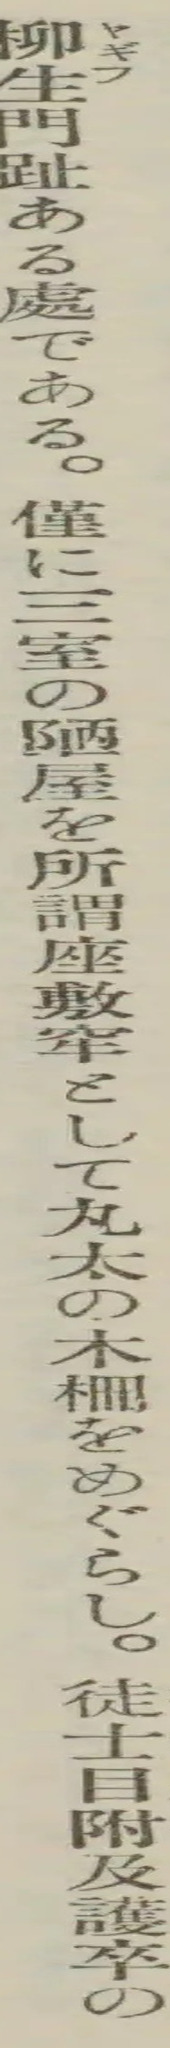柳生門趾ある処である。僅に三室の陋屋を所謂座敷牢として丸太の木柵をめぐらし。徒士目附及護卒の
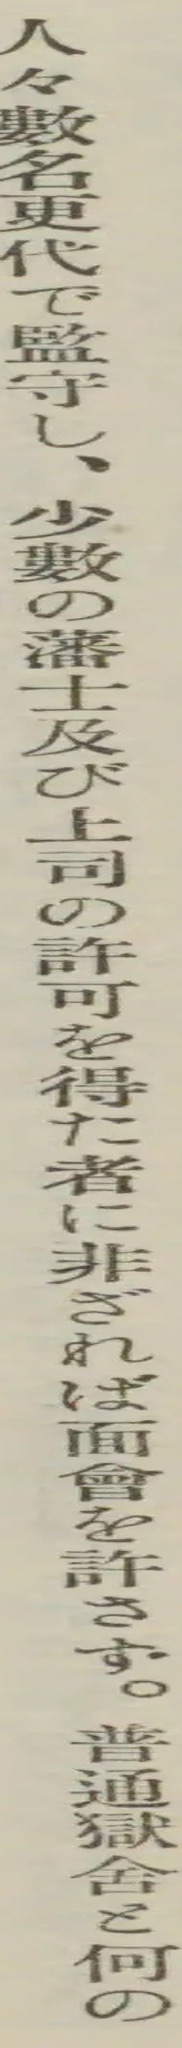人々数名更代で監守し、少数の藩士及び上司の許可を得た者に非ざれば面会を許さず。普通獄舎と何の
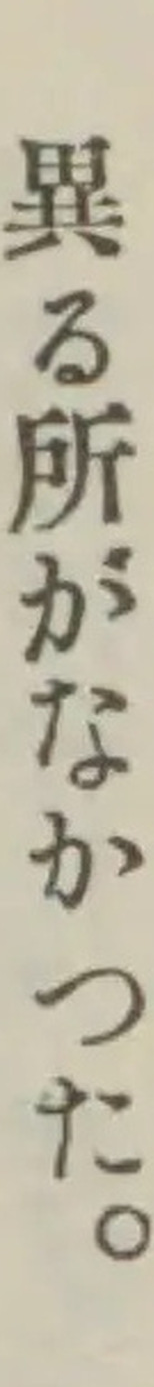異る所がなかつた。
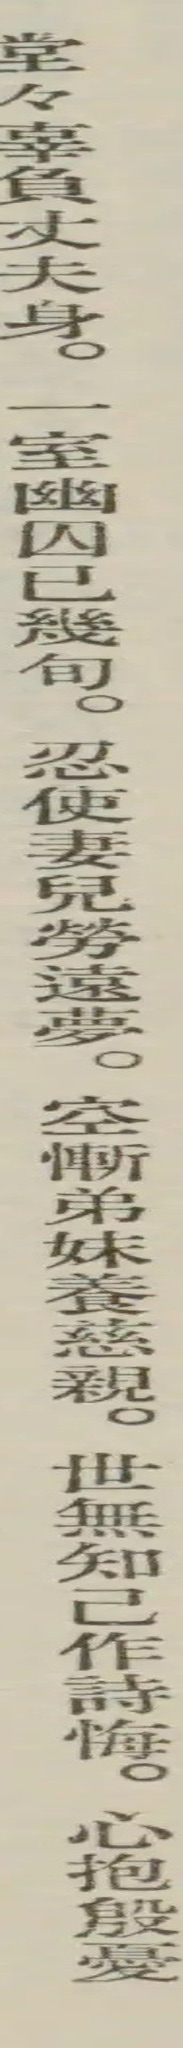堂々辜負丈夫身。一室幽囚已幾旬。忍使妻兒勞遠夢。空慚弟妹養慈親。世無智己作詩悔。心抱殷憂
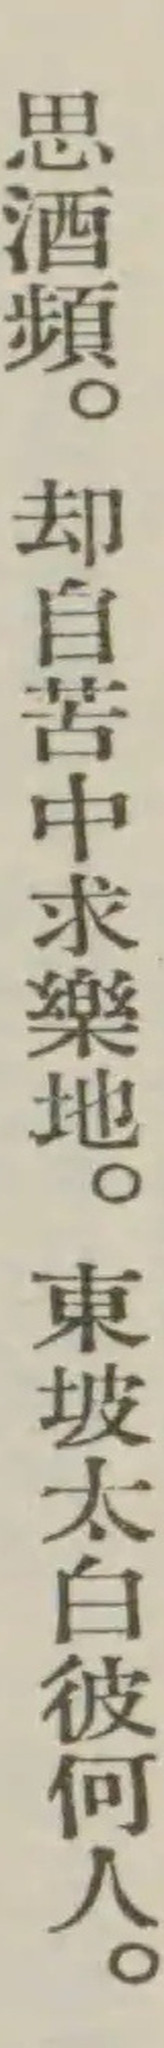思酒頻。却自苦中求樂地。東坡太白彼何人。
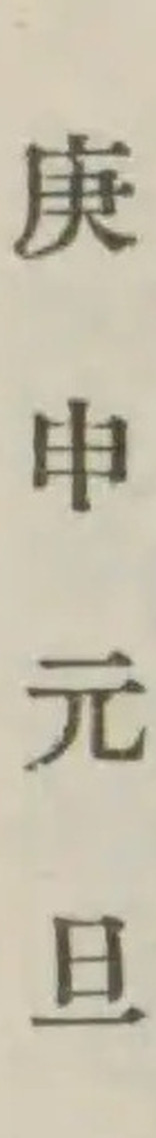庚申元旦
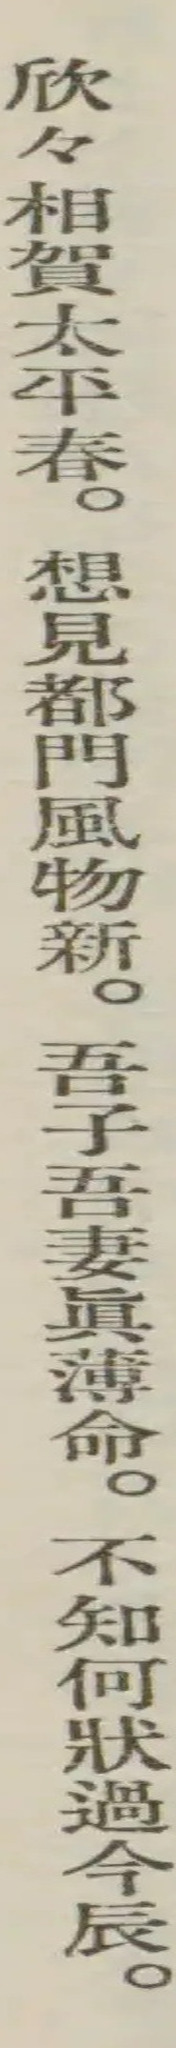欣々相賀太平春。想見都門風物新。吾子吾妻眞薄命。不知何狀過今辰。
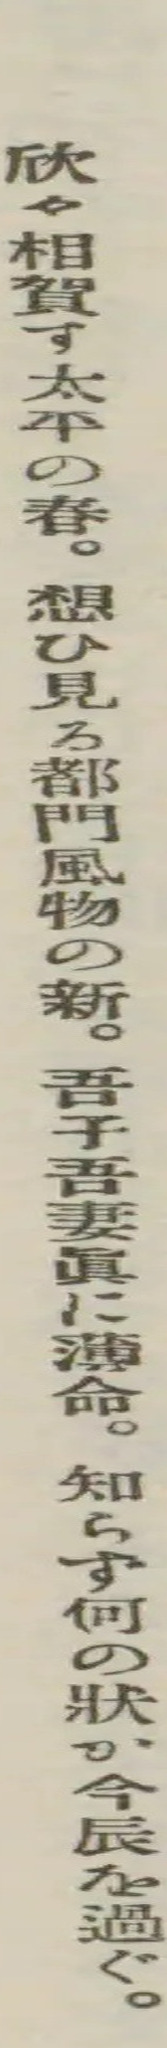欣々相賀す太平の春。想ひ見る都門風物の新。吾子吾妻真に薄命。知らず何の状か今辰を過ぐ。
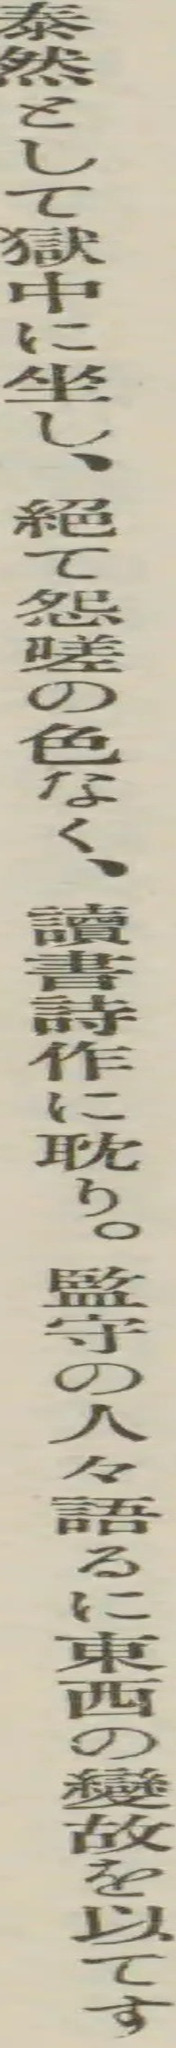翁泰然として獄中に坐し、絶て怨嗟の色なく、読書詩作に耽り。監守の人々語るに東西の変故を以てす
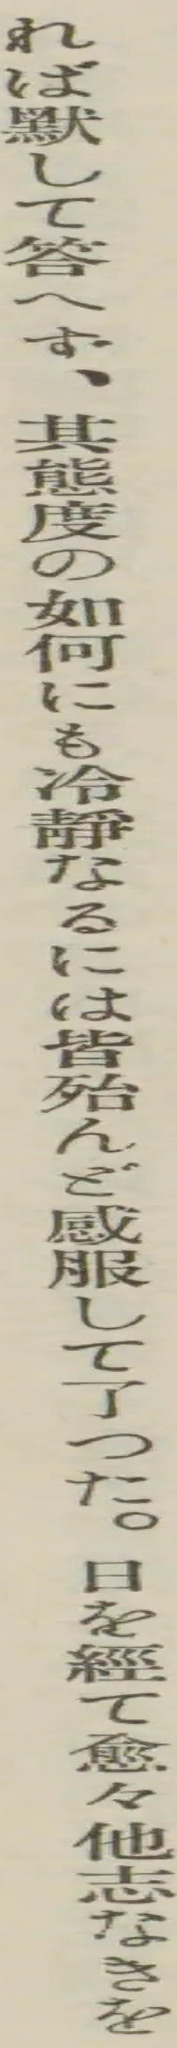れば黙して答へず、其態度の如何にも冷静なるには皆殆んど感服して了つた。日を経て愈々他志なきを
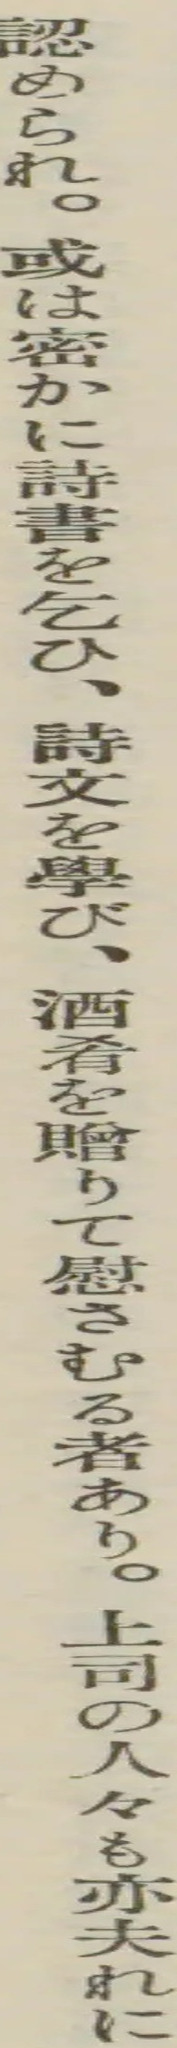認められ。或は密かに詩書を乞ひ、詩文を学び、酒肴を贈りて慰さむる者あり。上司の人々も亦夫れに

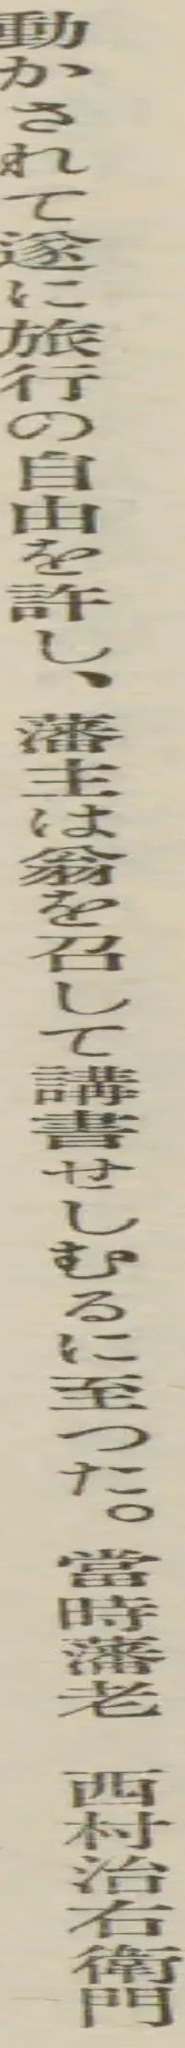動かされて遂に旅行の自由を許し、藩主は翁を召して講書せしむるに至つた。当時藩老西村治右衛門
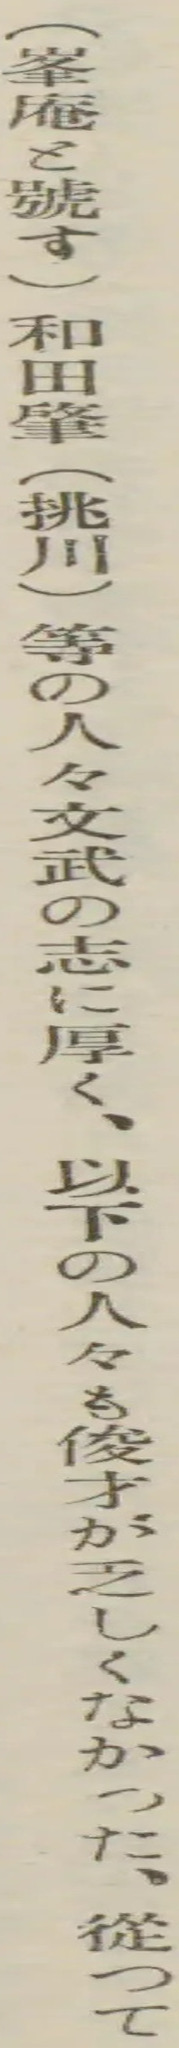(峯庵と号す)和田肇(挑川)等の人々文武の志に厚く、以下の人々も俊才が乏しくなかつた、従つて
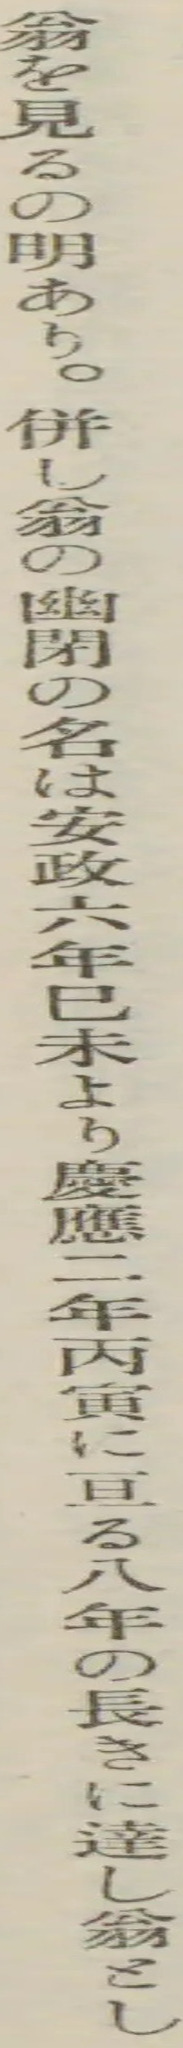翁を見るの明あり。併し翁の幽閉の名は安政六年己未より慶応二年丙寅に亘る八年の長きに達し翁とし
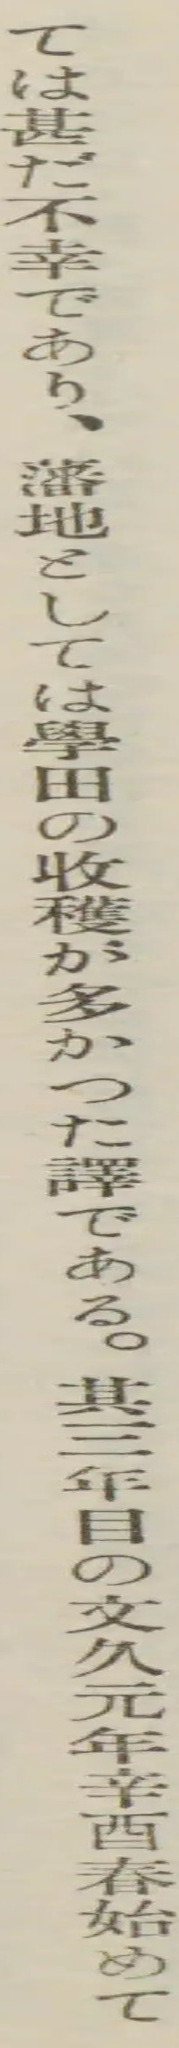ては甚だ不幸であり、藩地としては学田の収穫が多かつた訳である。其三年目の文久元年辛酉春始めて
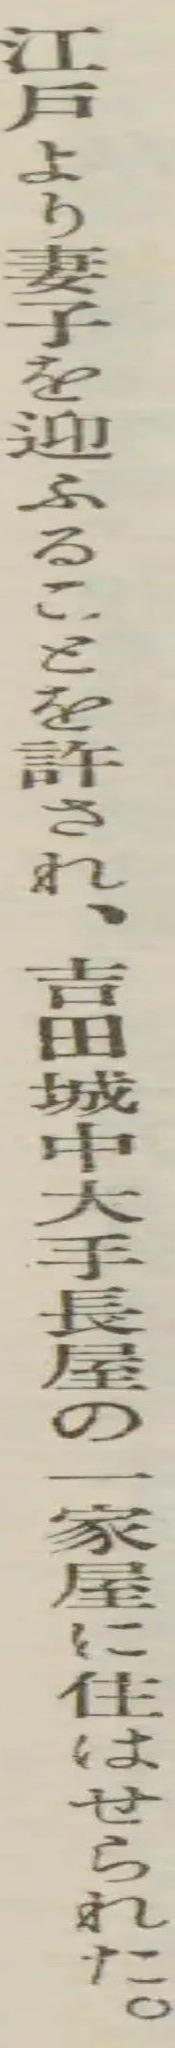江戸より妻子を迎ふることを許され、吉田城中大手長屋の一家屋に住はせられた。
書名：小野湖山翁小伝
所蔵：国立国会図書館 National Diet Library, JAPAN
